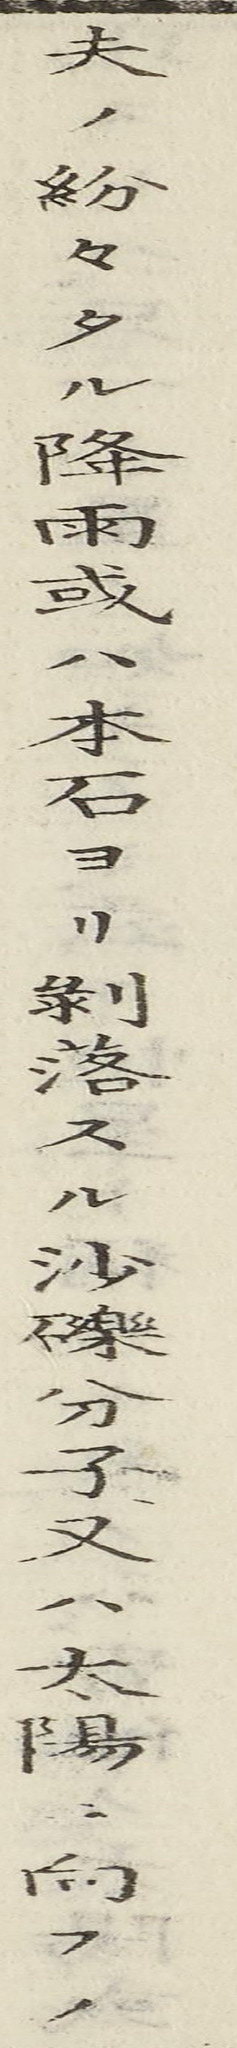夫ノ紛々タル降雨或ハ本石ヨリ剥落スル沙礫分子、又ハ太陽ニ向フノ
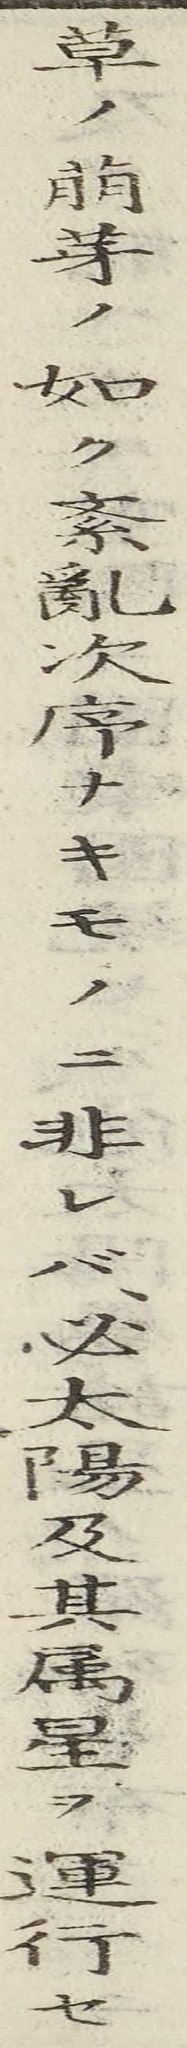草ノ萌芽ノ如ク紊乱次序ナキモノニ非レバ、必太陽及其属星ヲ運行セ
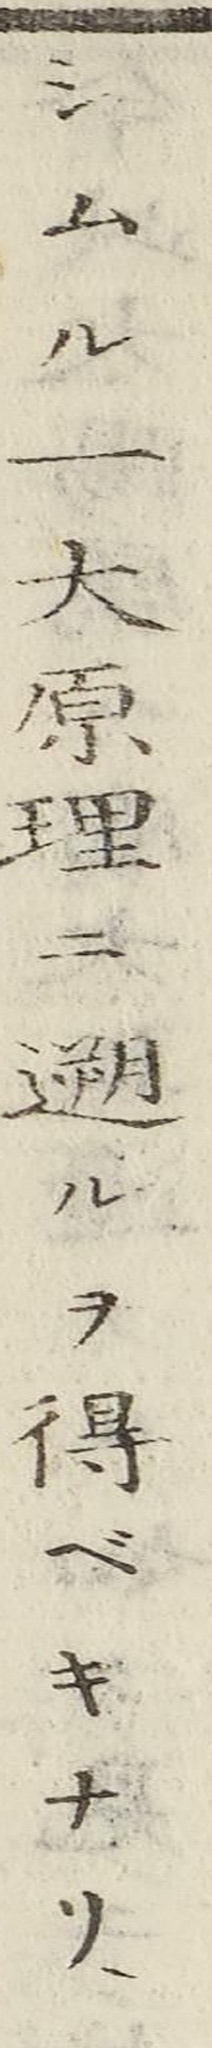シムル一大原理ニ遡ルヲ得ベキナリ、

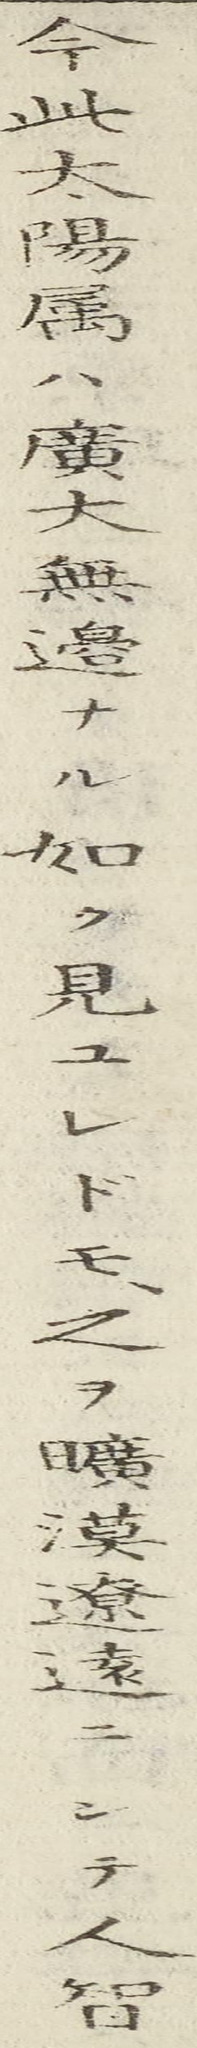今此太陽属ハ広大無辺ナル如ク見ユレドモ、之ヲ曠漠遼遠ニシテ人智
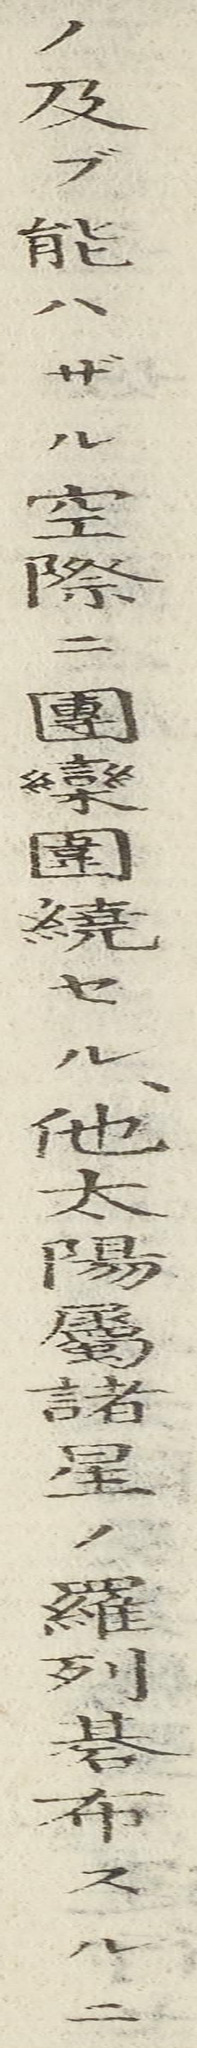ノ及ブ能ハザル空際ニ団欒団繞セル、他太陽属諸星ノ羅列碁布スルニ
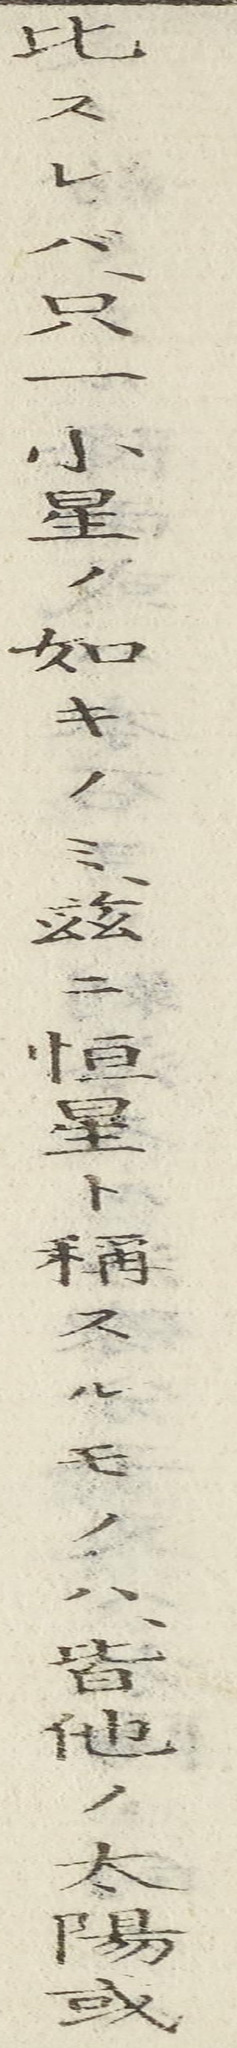比スレバ、只一小星ノ如キノミ、爰ニ恒星ト称スルモノハ、皆他ノ太陽或
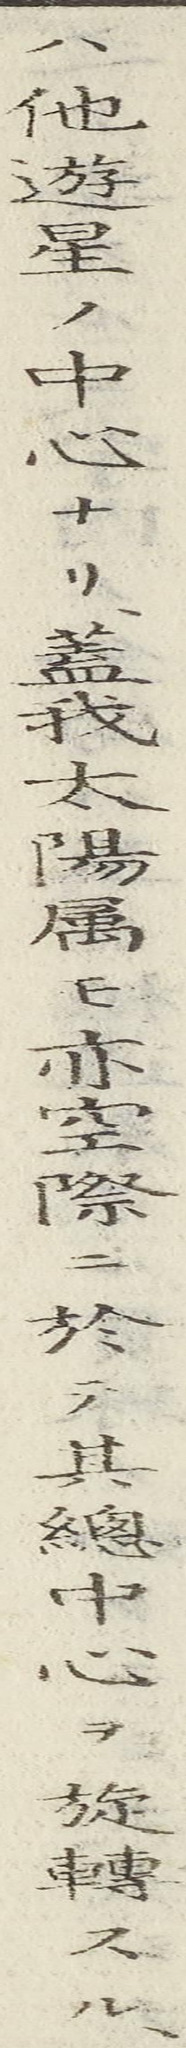ハ他遊星ノ中心ナリ、蓋我太陽属モ亦空際ニ於テ其総中心ヲ旋転スル、
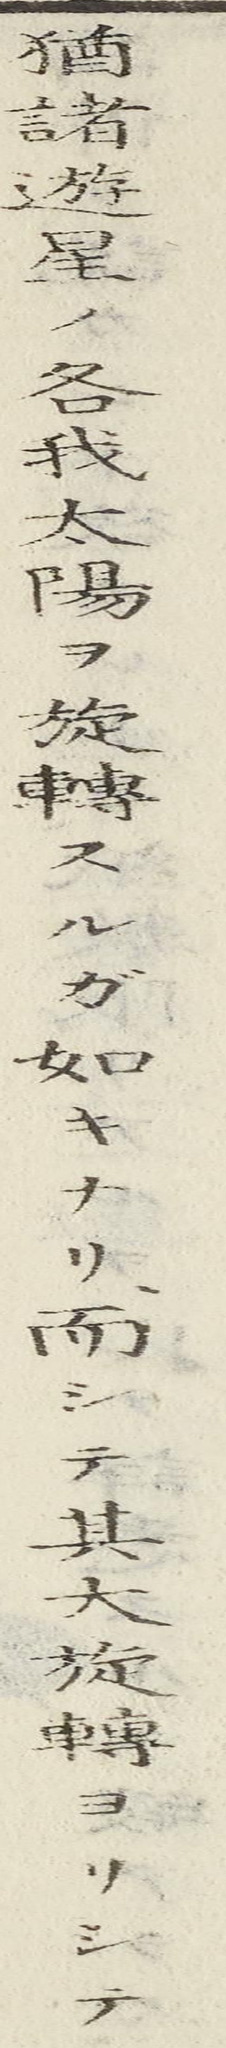猶諸遊星ノ各我太陽ヲ旋転スルガ如キナリ、而シテ其大旋転ヨリシテ
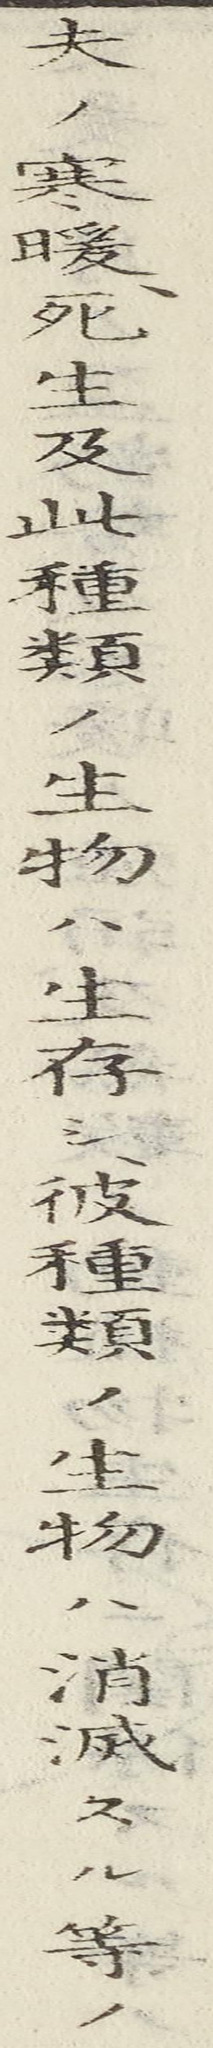夫ノ寒暖、死生及此種類ノ生物ハ生存シ、彼種類ノ生物ハ消滅スル等ノ
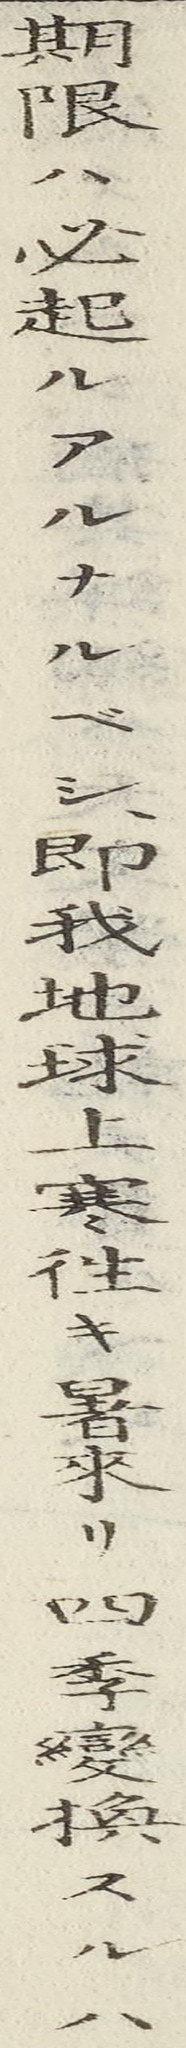期限ハ必起ルアルナルベシ、即我地球上寒往キ暑来リ四季変換スルハ
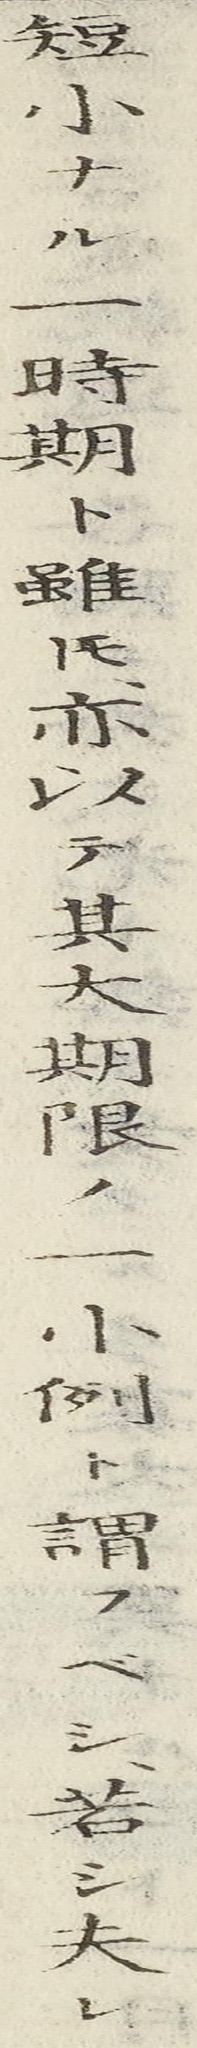短小ナル一時期ト雖トモ、亦以テ其大期限ノ一小例ト謂フベシ、若シ夫レ
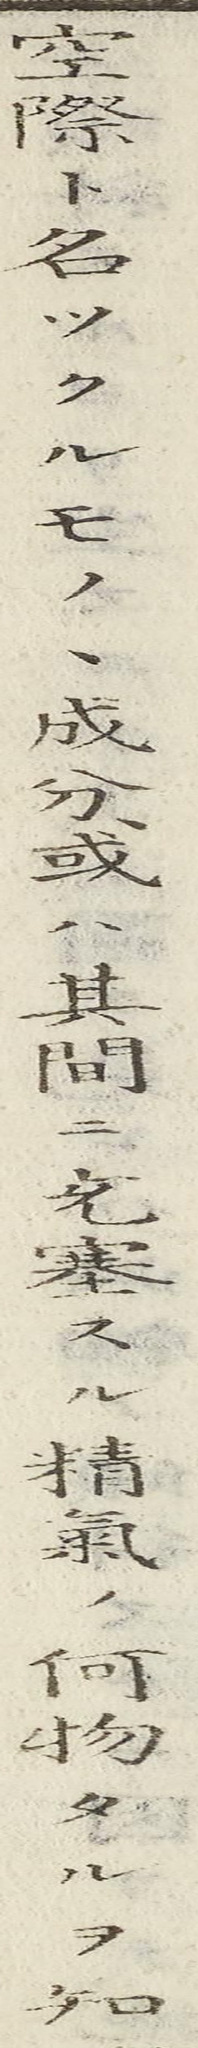空際ト名ツクルモノヽ成分或ハ其間ニ兂塞スル精気ノ何物タルヲ知
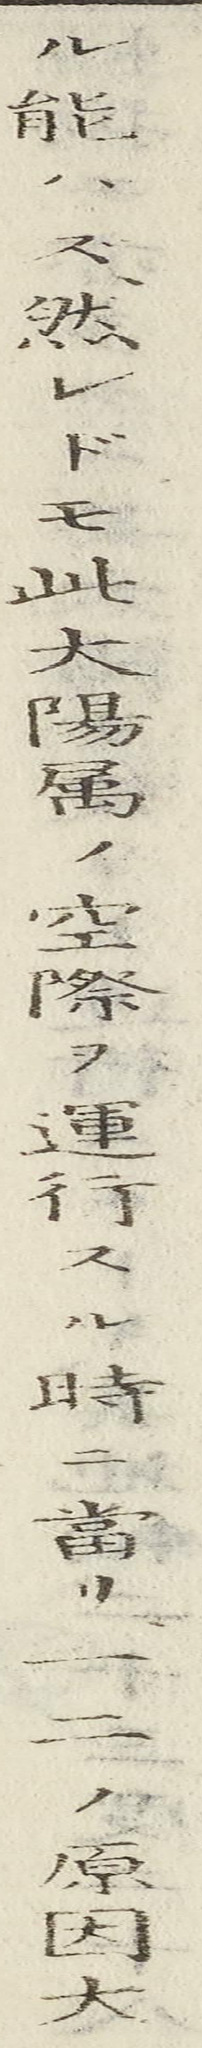ル能ハズ、然レドモ此太陽属ノ空際ヲ運行スル時ニ当リ、一二ノ原因大
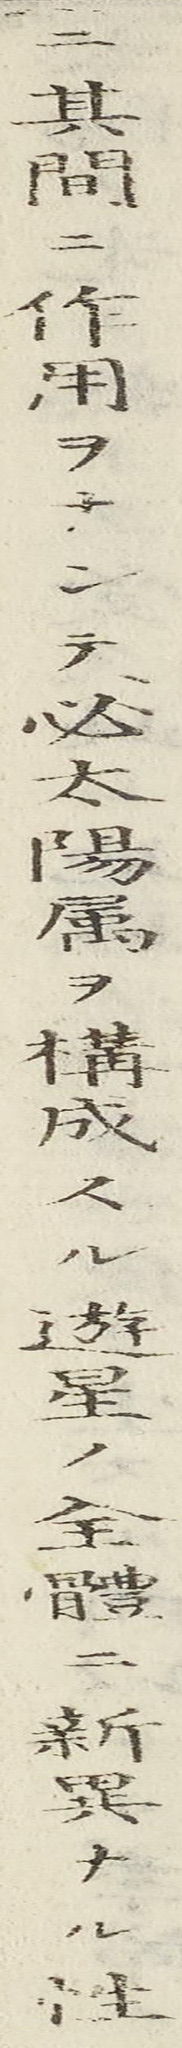ニ期間ニ作用ヲナシテ、必太陽属ヲ構成スル遊星ノ全体ニ新異ナル性
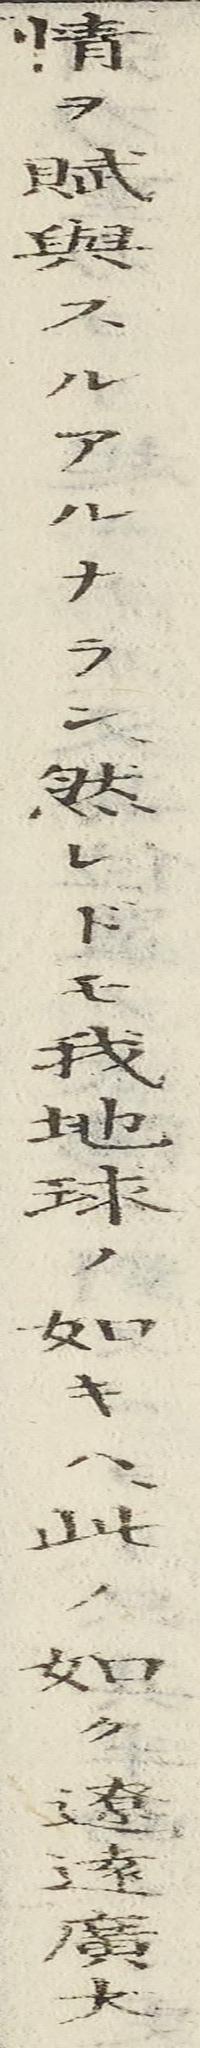情ヲ賦与スルアルナラン、然レドモ我地球ノ如キハ、此ノ如ク遼遠広大
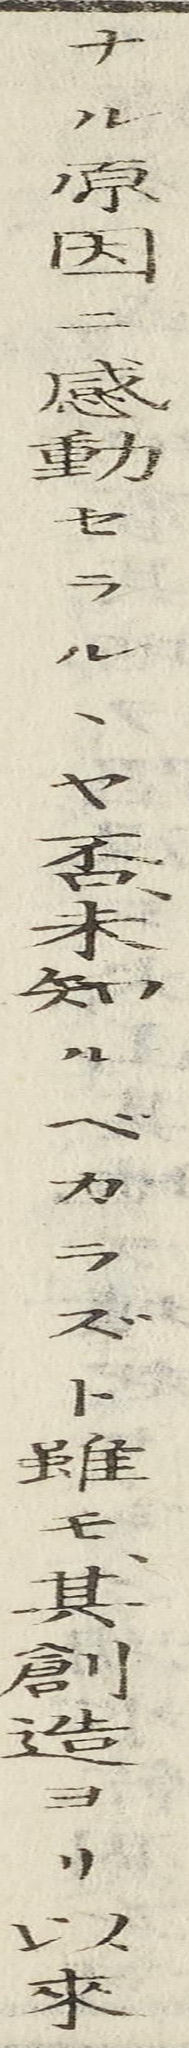ナル原因ニ感動セラルヽヤ否、未知ルベカラズト雖モ、其創造ヨリ以来
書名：百科全書　地文學　全
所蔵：東京大学地震研究所図書室 Earthquake Research Institute Library, The University of Tokyo, JAPAN
